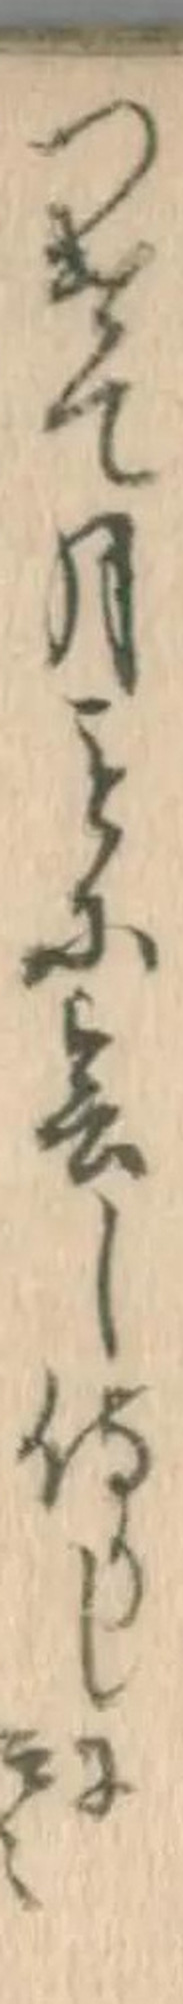つけて月ことに会し侍りしに
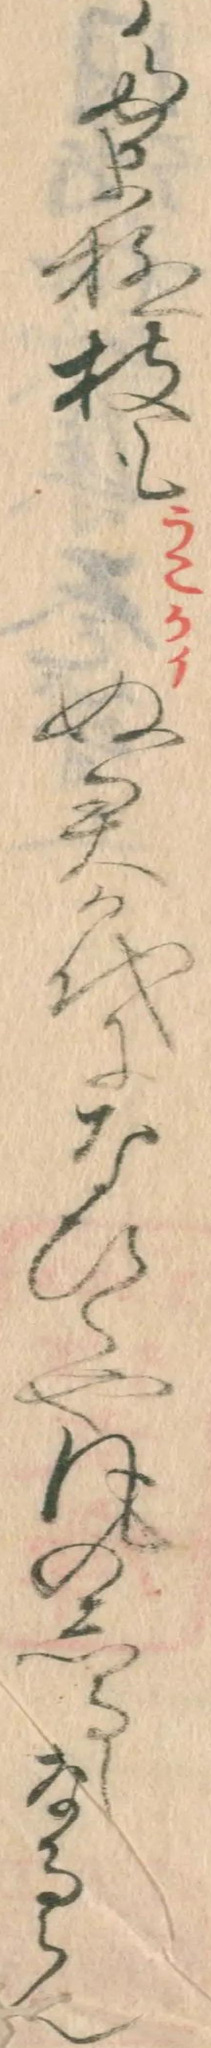たま柳枝もぬ君か代になひくや風のしるしなるらん
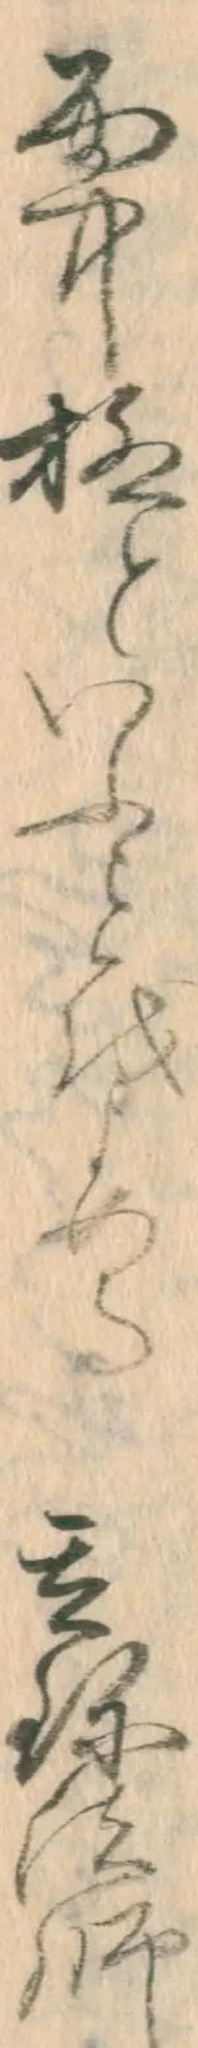雨中柳といふことをよめる玄珍法師
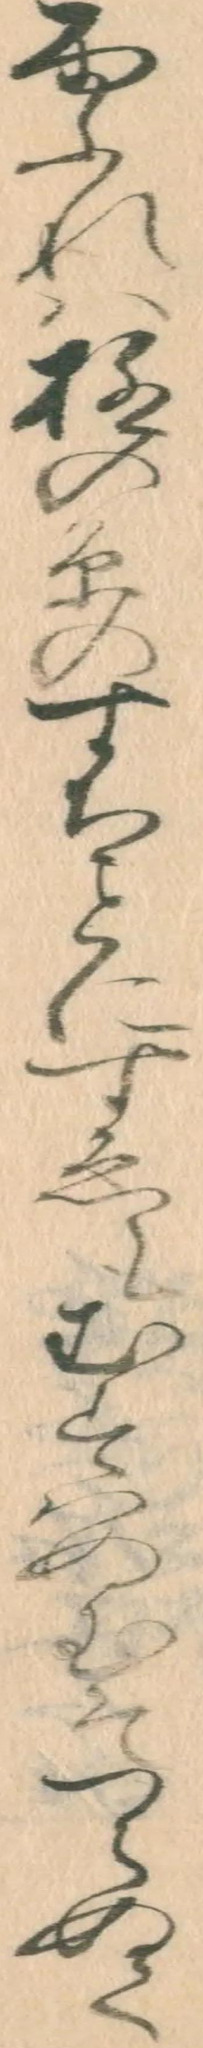雨ふれは柳の糸のすちことにすゑもむすはぬ玉そつらぬく
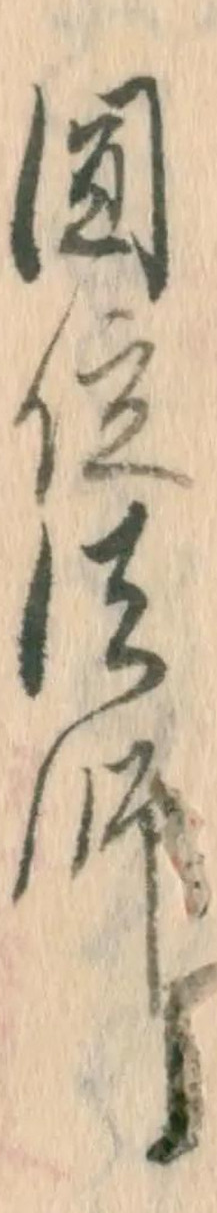円位法師
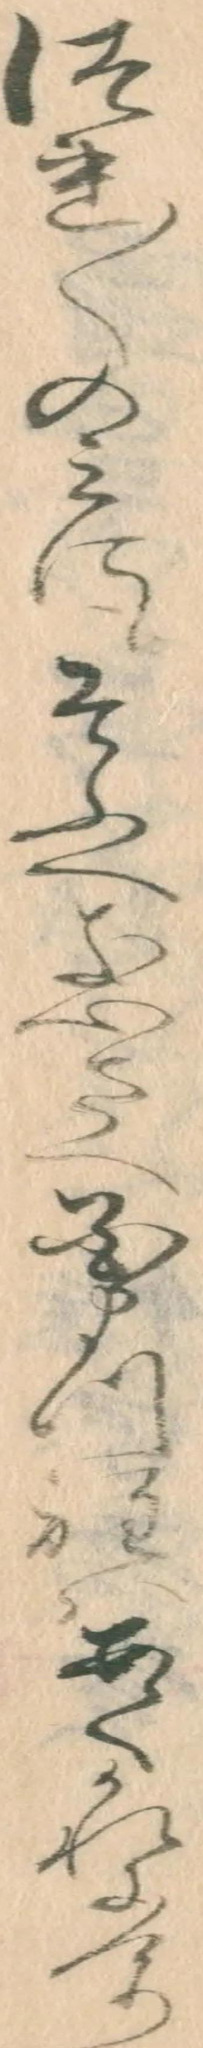つれ〳〵のみにもそふへき心さへ花まつ程はあくかれにけり
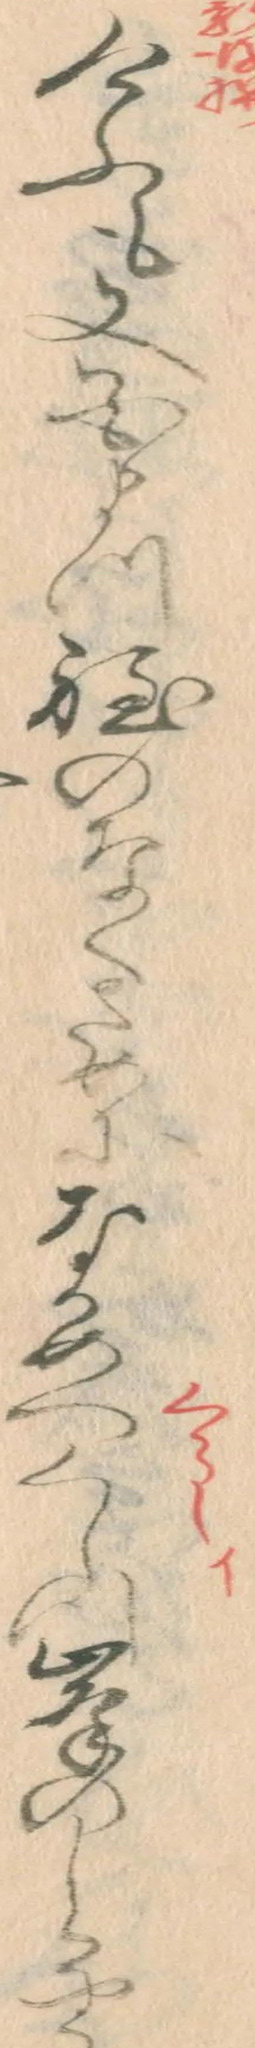けふも又花まつ程のなくさめになかめつくしつ峯のしら雲
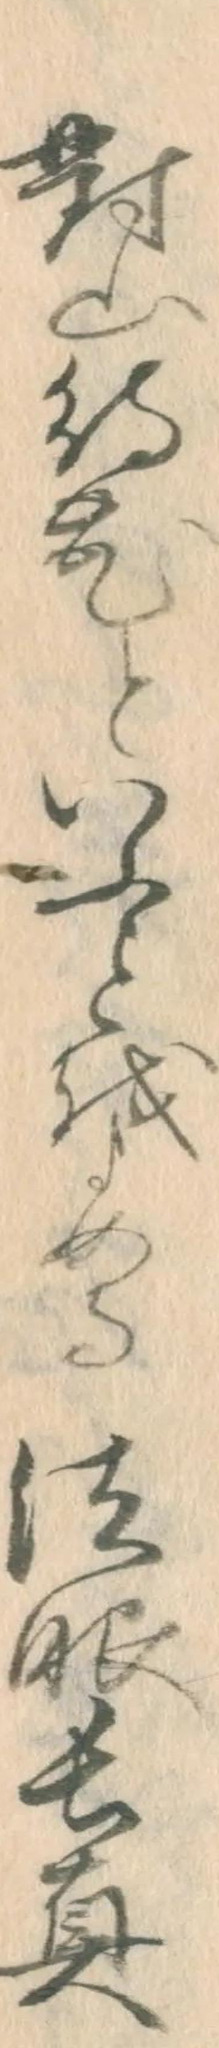対山待花といふことをよめる方眼長真
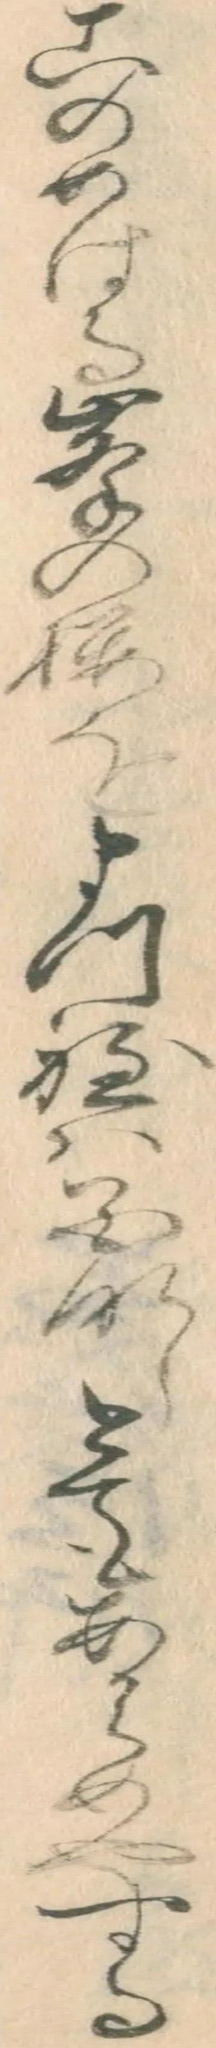このめはる峯の桜をまつ程は花なしとてもあからめやする

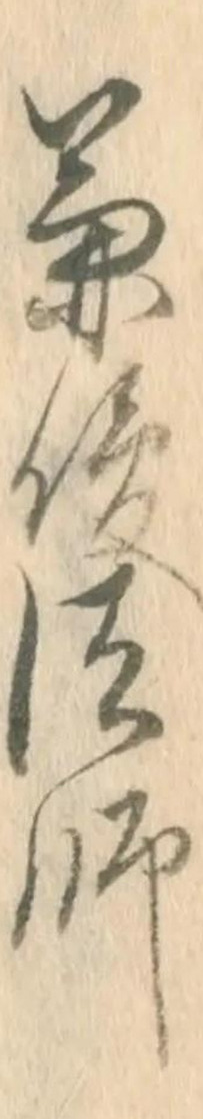兼俊法師
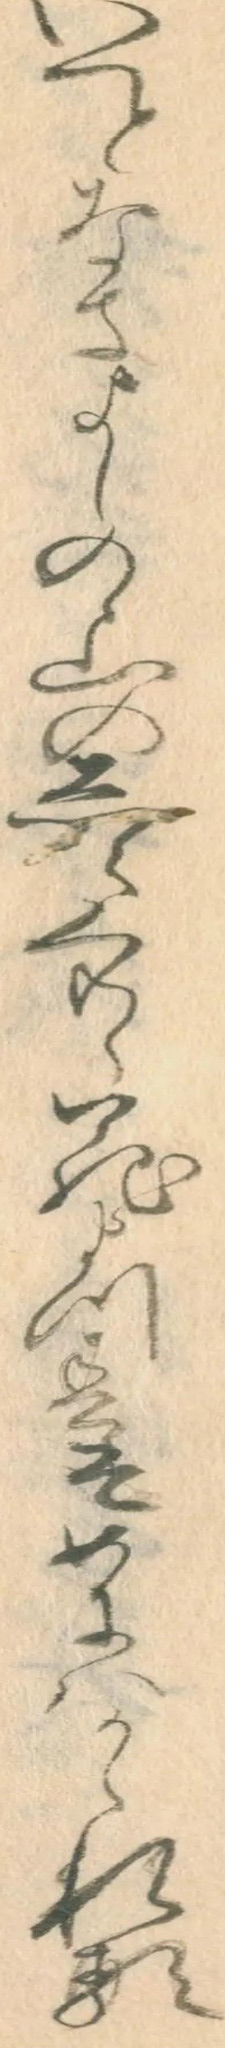いつとなきよしのゝ山のしらくもゝ花まつ春そめにはかたれる
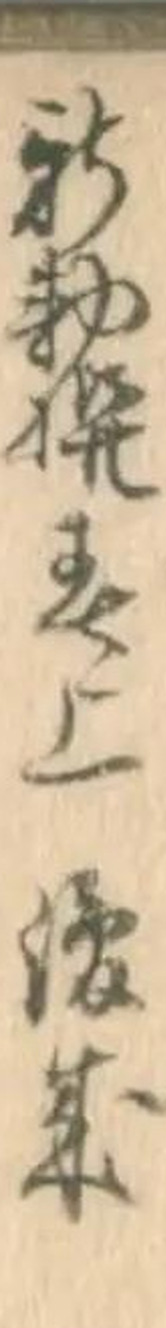新勅撰春上俊成
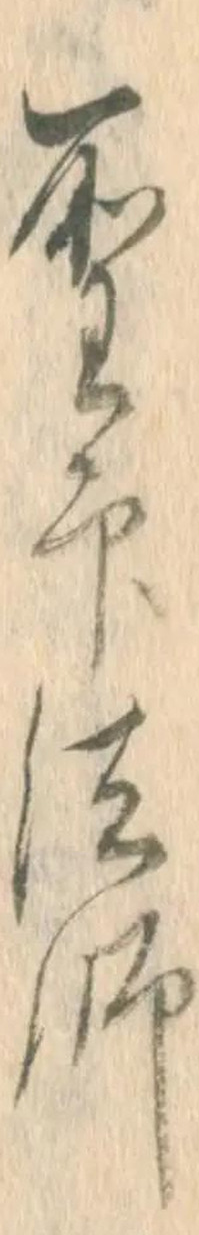聖印法師
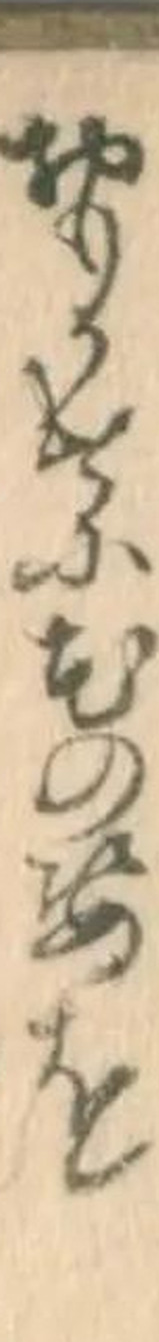おもかけに花の姿を
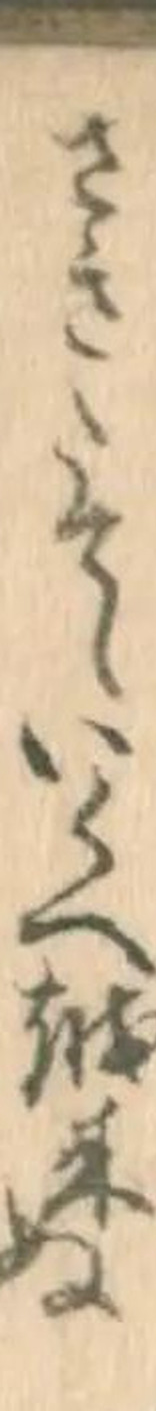さきたてゝいくへを成ぬ
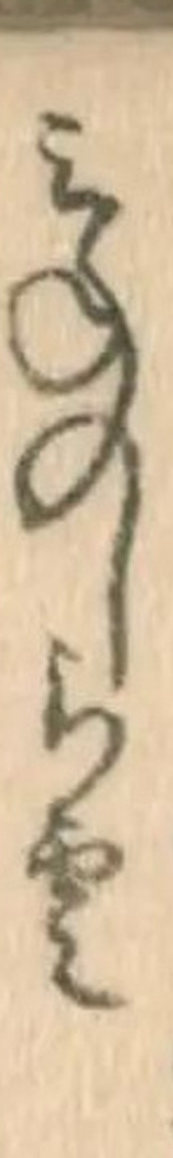みねのしら雲
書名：月詣和歌集
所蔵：国立国会図書館 National Diet Library, JAPAN
